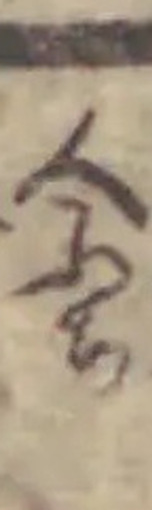人ふち
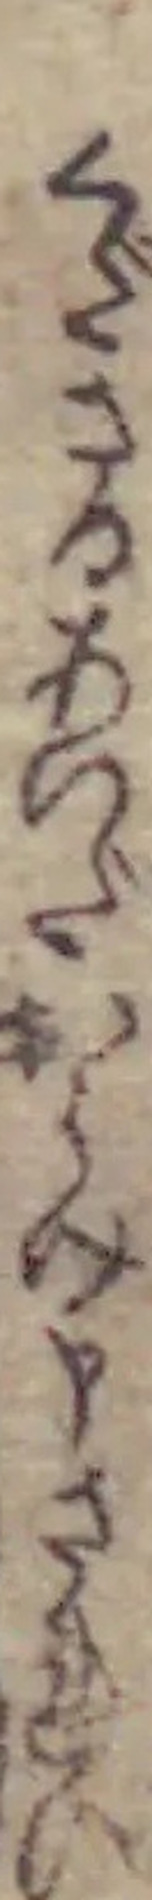くださるあいだおうけ申されい
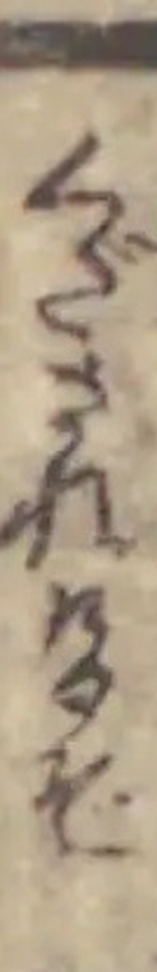くだされけるぞ
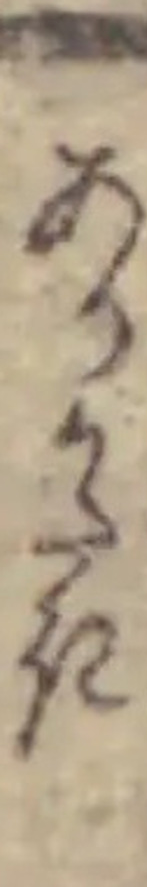ありかたき
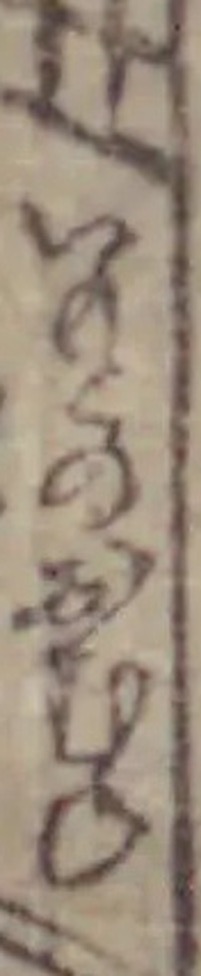いもとのおむね
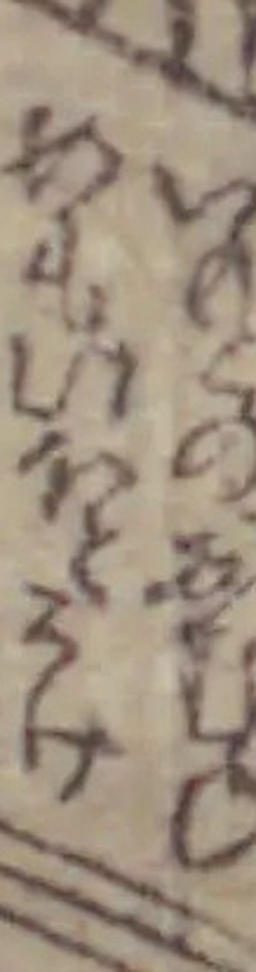めも此ほとうけ
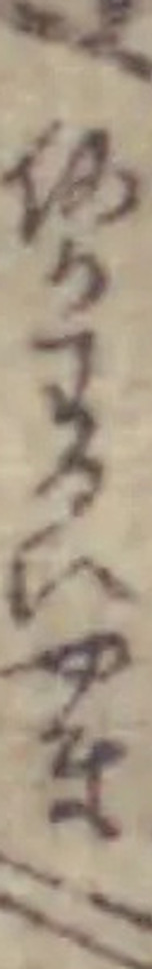何かわるいやま
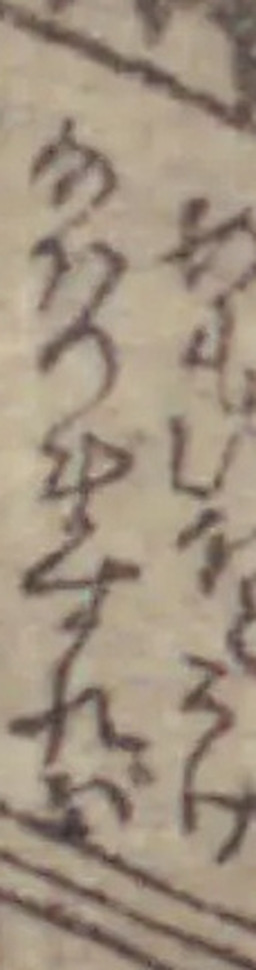給はりますれば
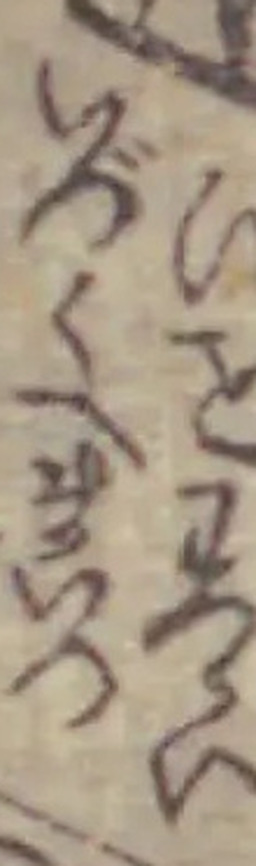いづくへまいつ
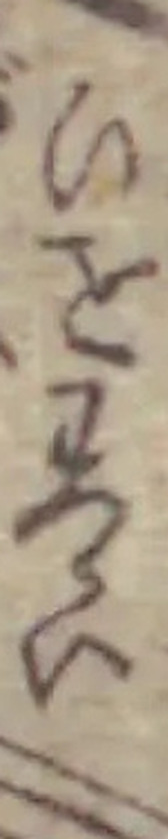ひをわつらい
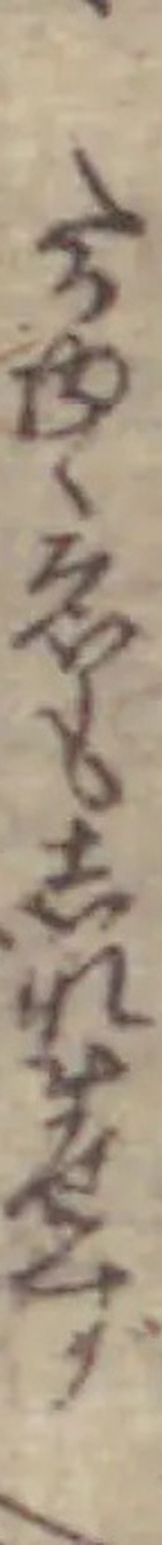たかゆくゑもしれませず
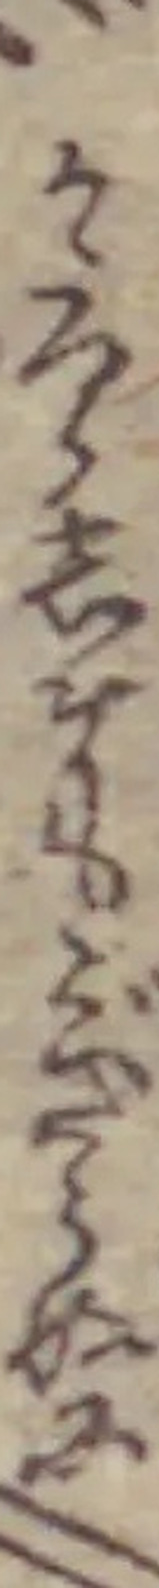かくこかしまもごさらぬに
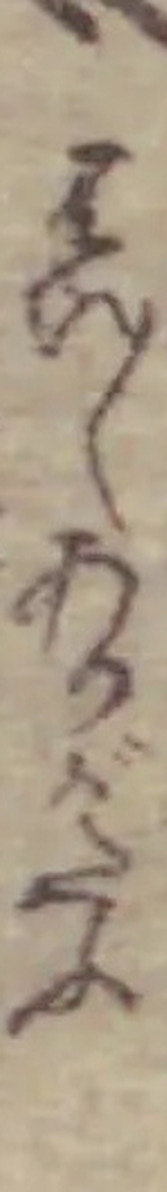はい〳〵ありがたふ
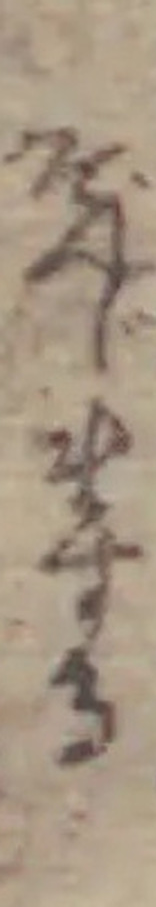ぞんじまする

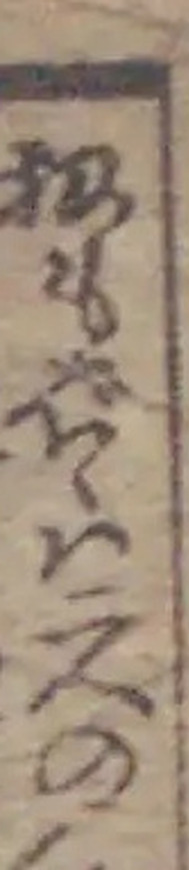扨もばゞは二人の
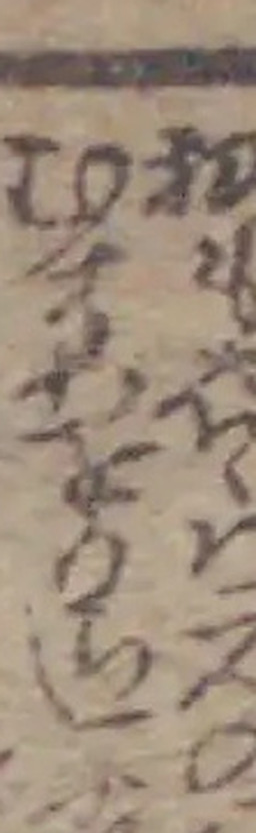むすめをもちしに
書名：奥州咄 3巻
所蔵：国立国会図書館 National Diet Library, JAPAN
